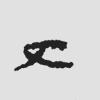不
